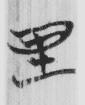里
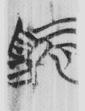駝
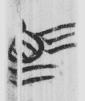馬
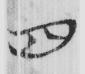四
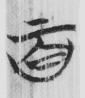百
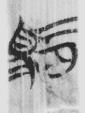駟
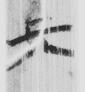亓
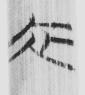衣
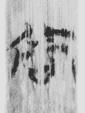尚
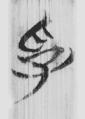孚
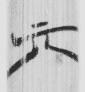亓
